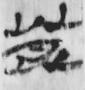莫
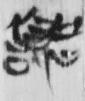囂
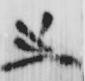之
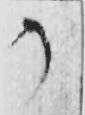人
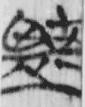○（盬）
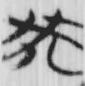癸
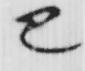巳
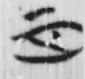正
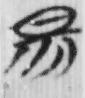昜（陽）
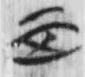正
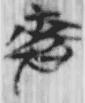差
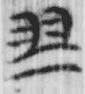翏
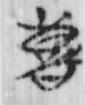喜
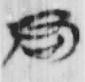君
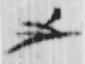之
